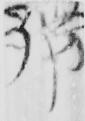○（濮）
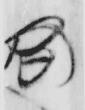君
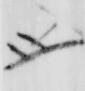之
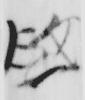○（地）
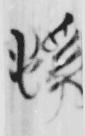溪
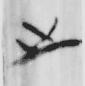之
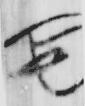𠁩
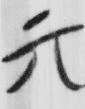亓（其）
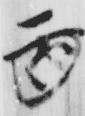百
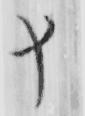又
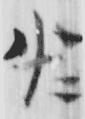八十
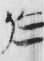於
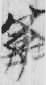畢
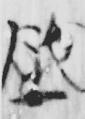地
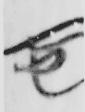𠁩
